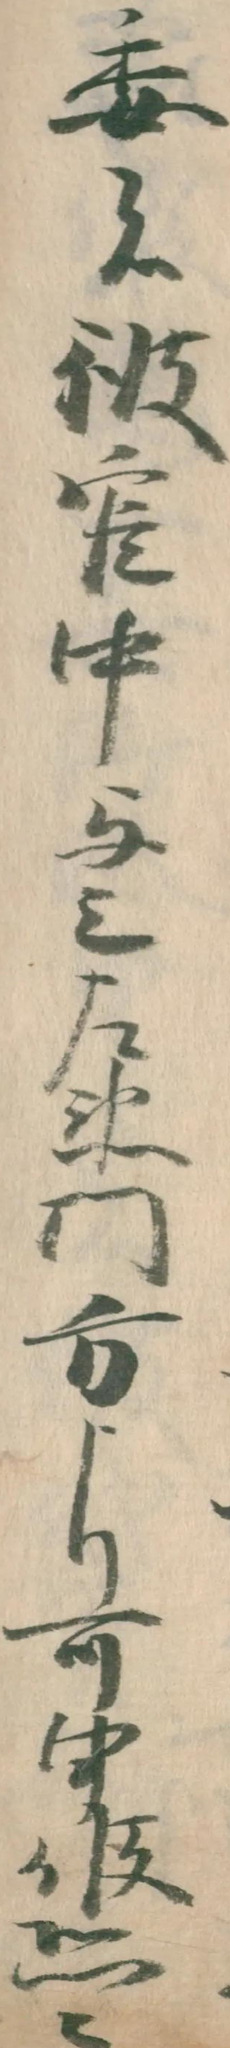委者被官中与三左衛門方より可申候恐々

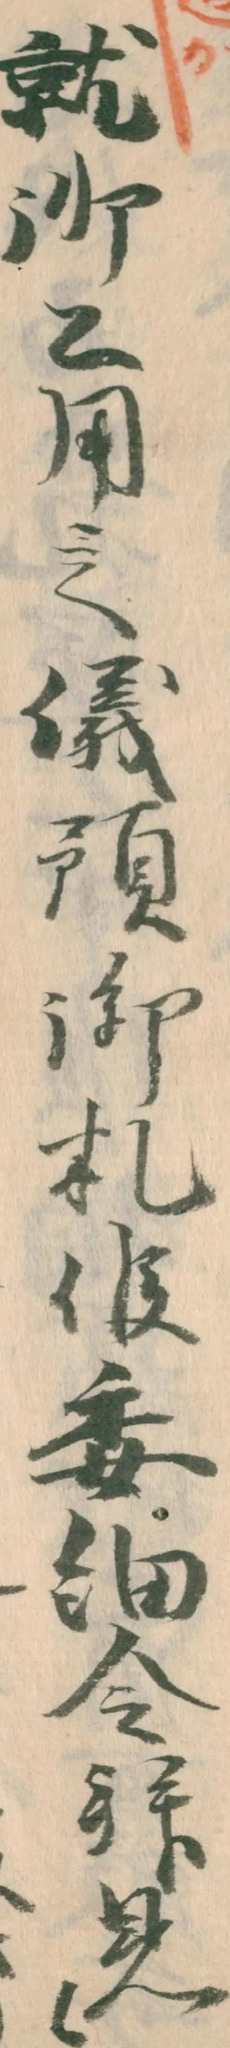就御公用之儀預御札候委細令拝見候
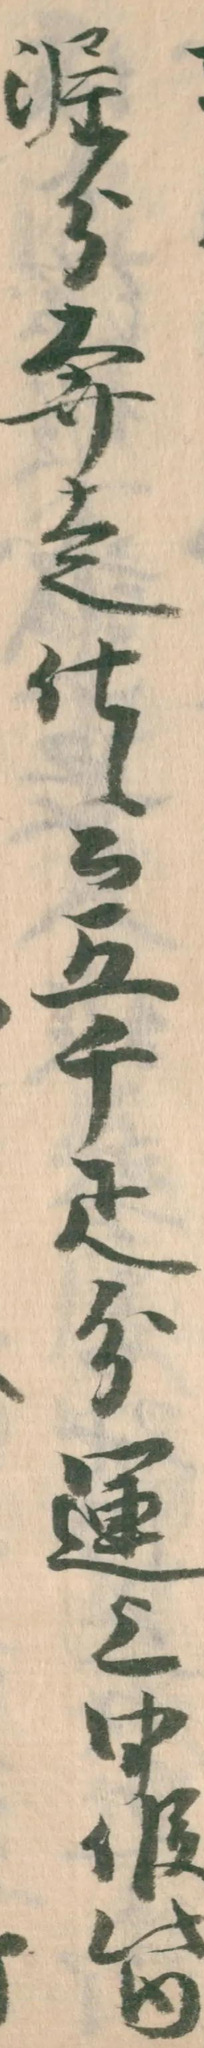涯分奔走仕候而五千疋分運上申候此内
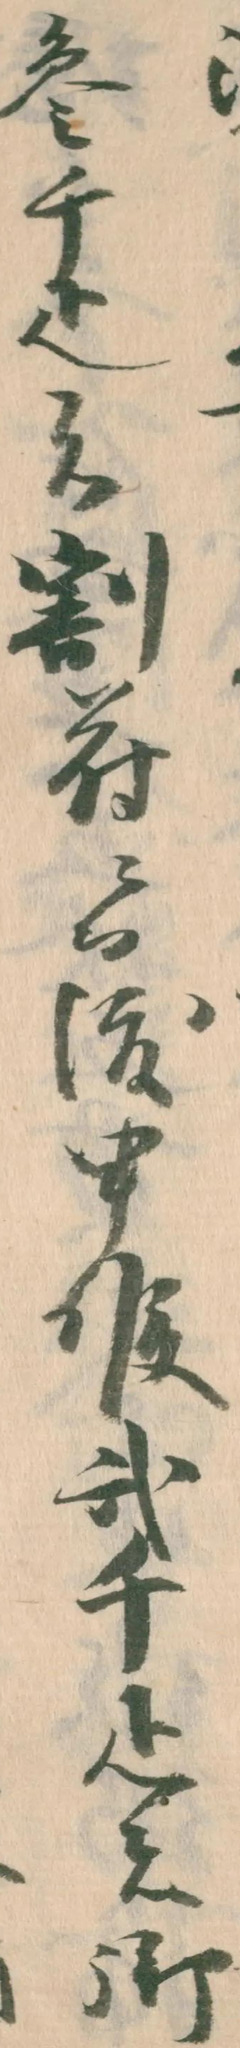参千疋者割符而渡申候弐千疋者御
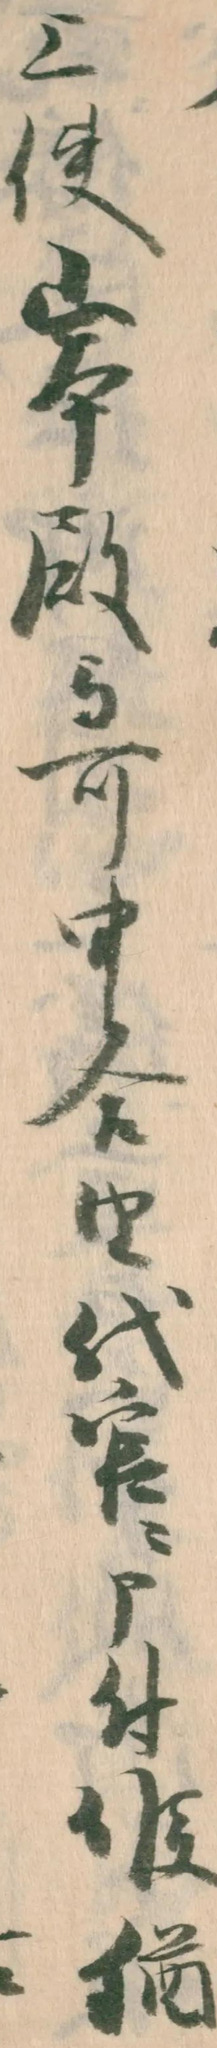上使山本殿与可申合由代官申付候猶
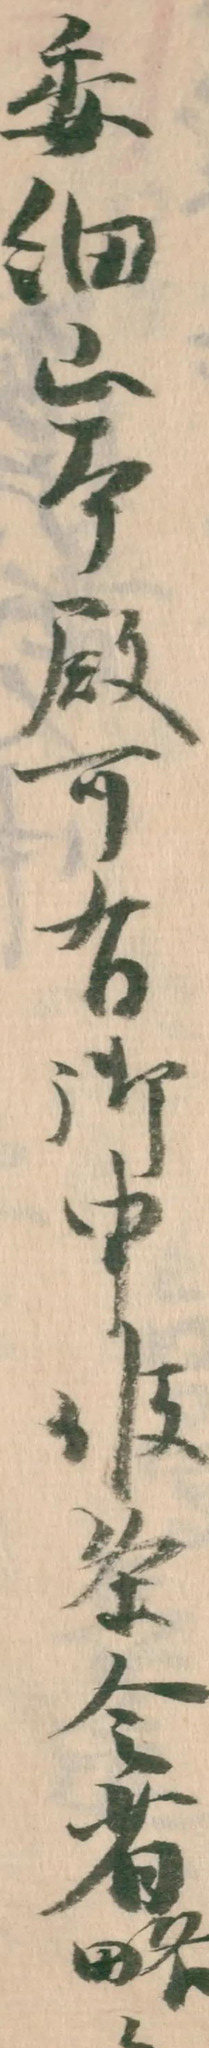委細山本殿可有御申候条令省略候
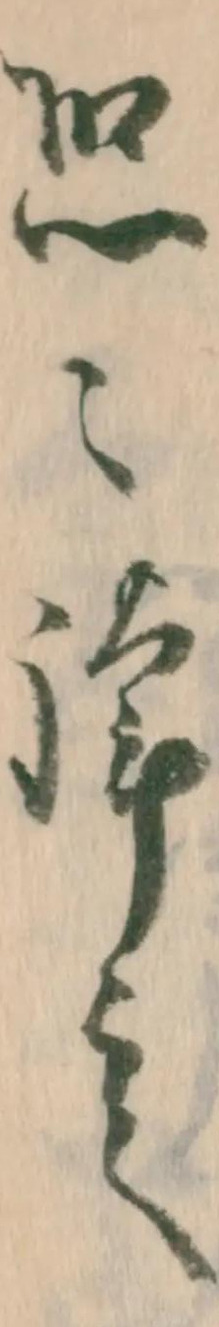恐々謹言
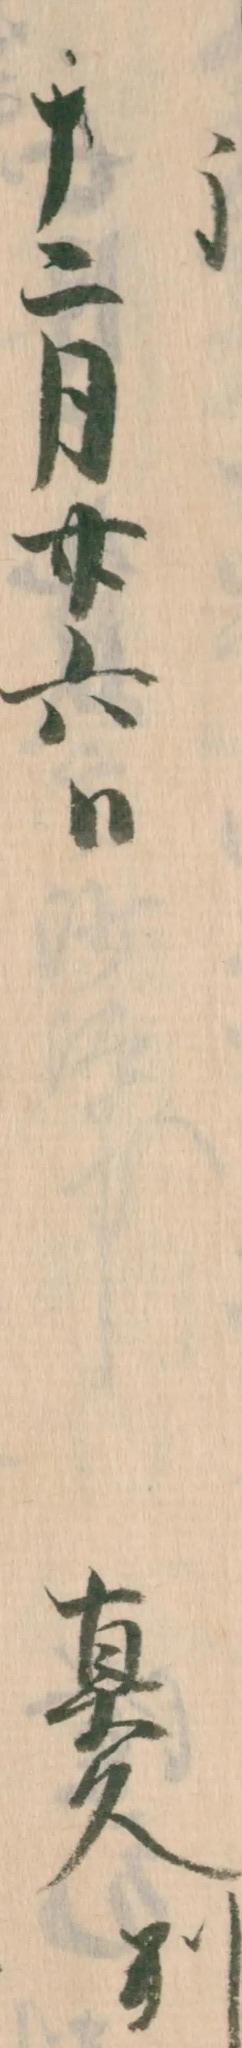十二月廿六日真久判
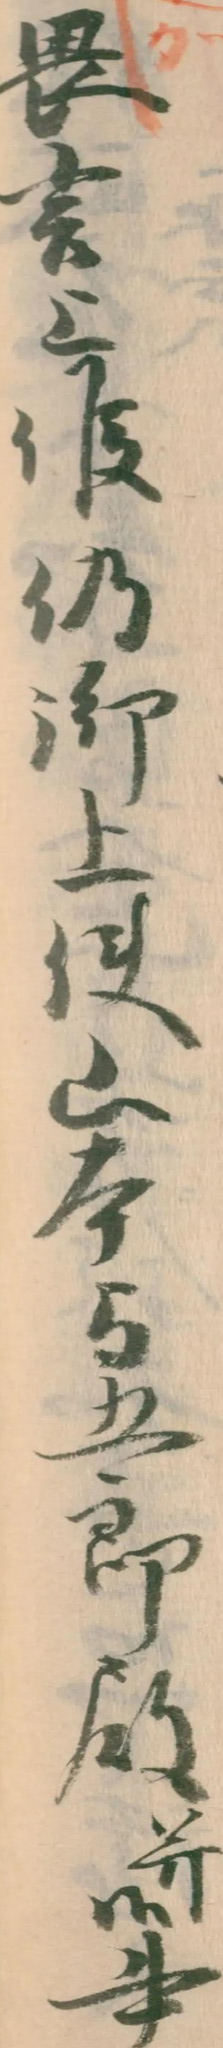畏言上候仍御上使山本与五郎殿并御書
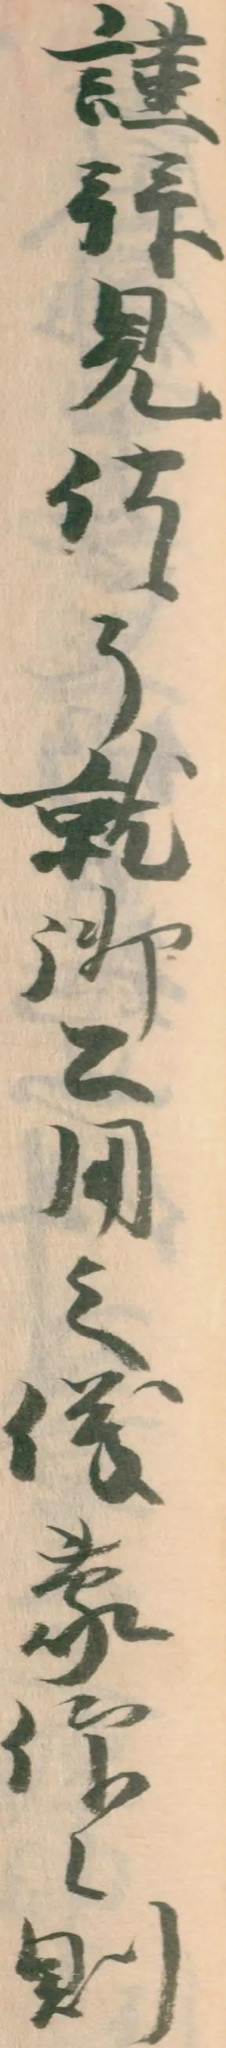謹拝見仕候了就御公用之儀蒙仰候則
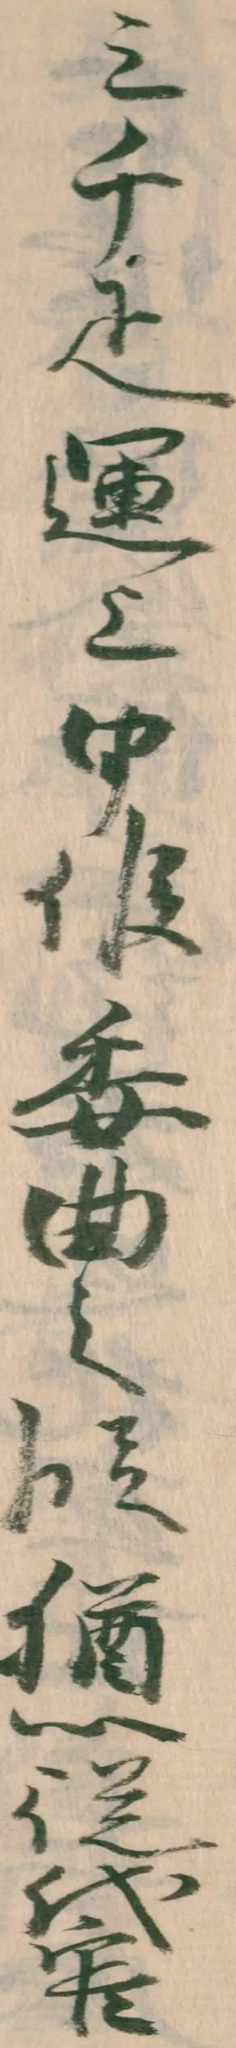三千疋運上申候委曲之段猶以従代官
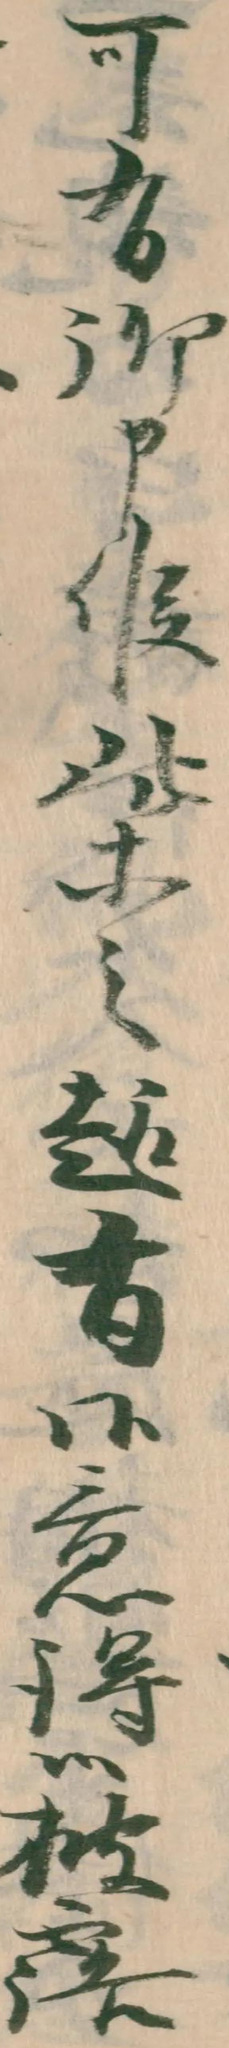可有御申候此等之趣有御意得御披露
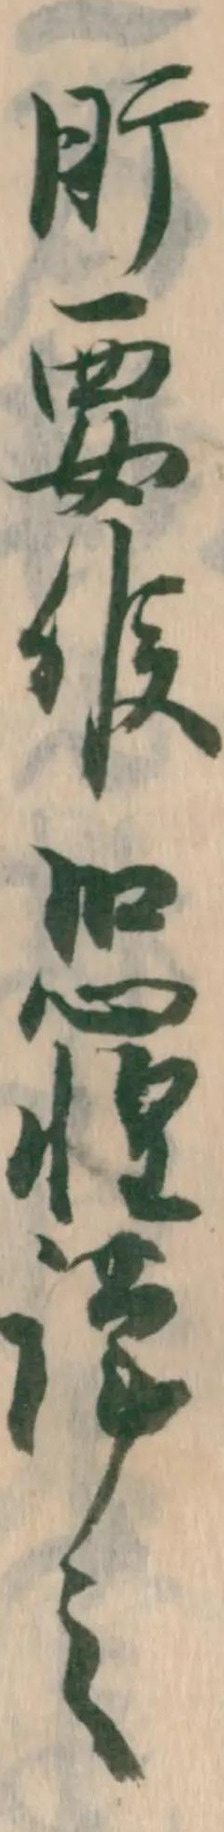肝要候恐惶謹言
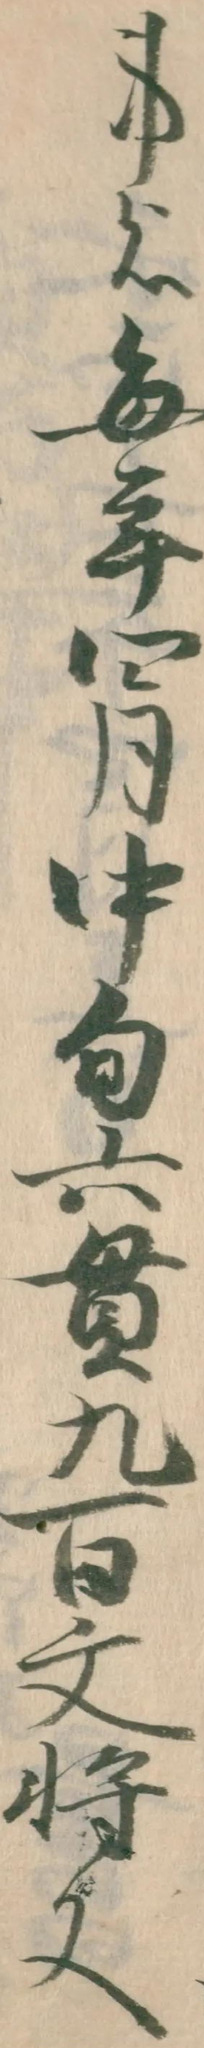事者毎年四月中旬六貫九百文将又
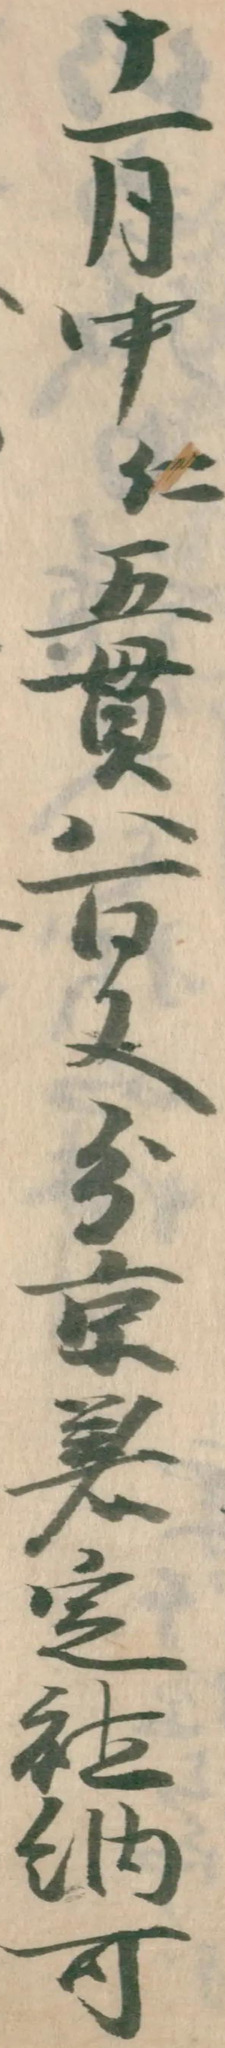十一月中仁五貫八百文分京着定社納可
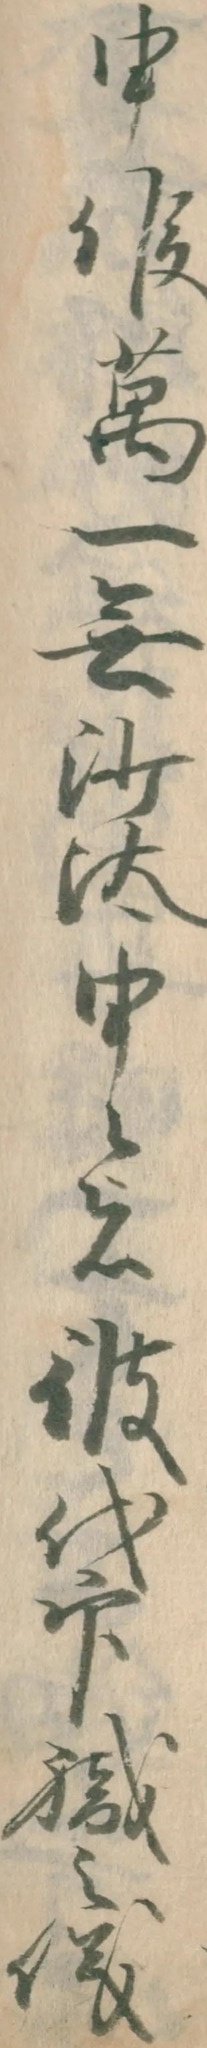申候万一無沙汰申候者彼代官職之儀
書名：賀茂社記録. 第1冊
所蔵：国立国会図書館 National Diet Library, JAPAN
